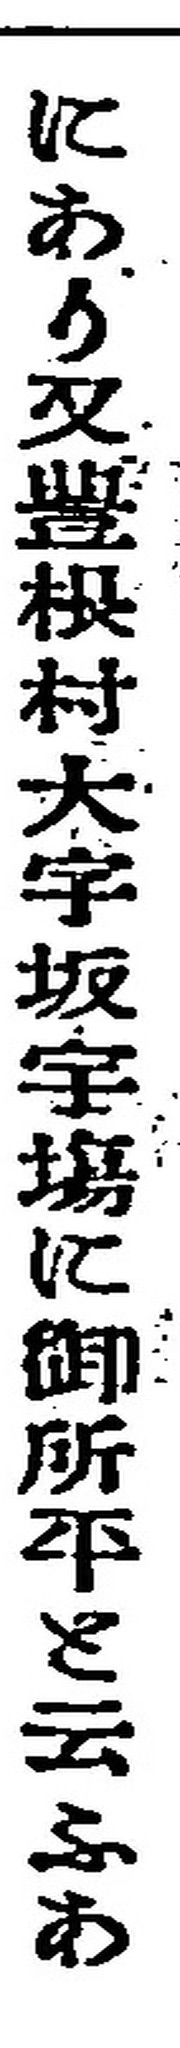にあり又豊根村大字坂宇場に御所平と云ふあ
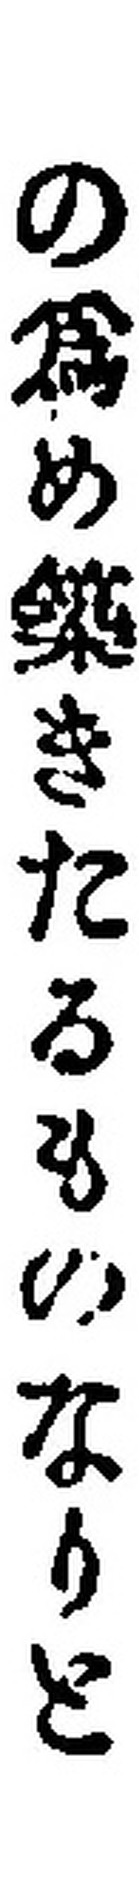の為め築きたるものなりと
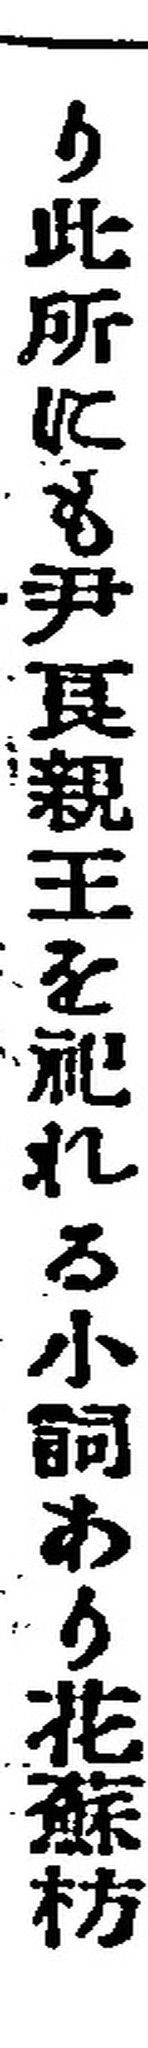り此所にも尹良親王を祀れる小祠あり花蘇枋
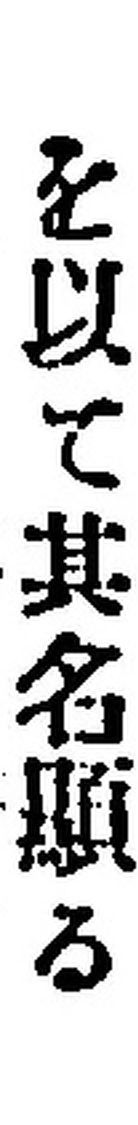を以て其名顕る
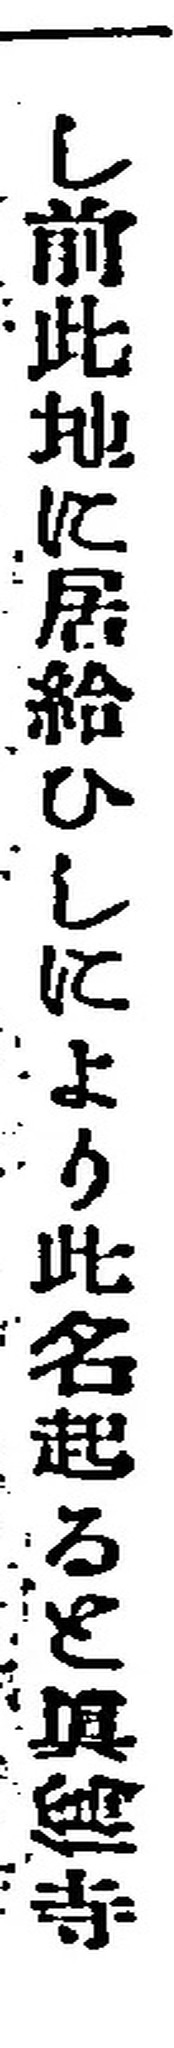し前此地に居給ひしにより此名起ると真偽寺
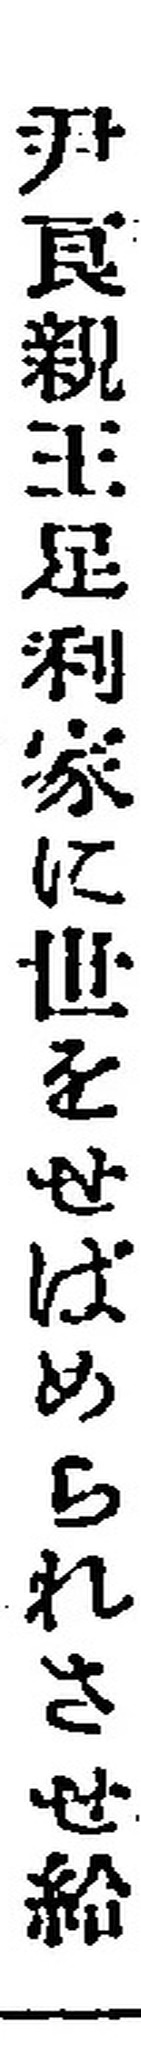尹良親王足利家に世をせばめられさせ給
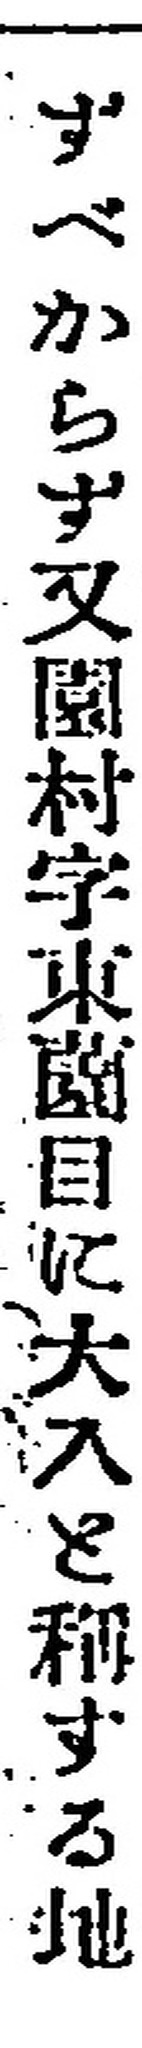ずべからず又園村字東薗目に大入と称する地
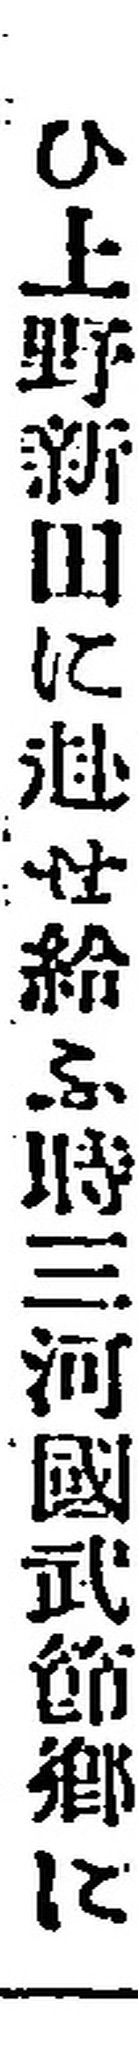ひ上野新田に赴せ給ふ時三河国武節郷に
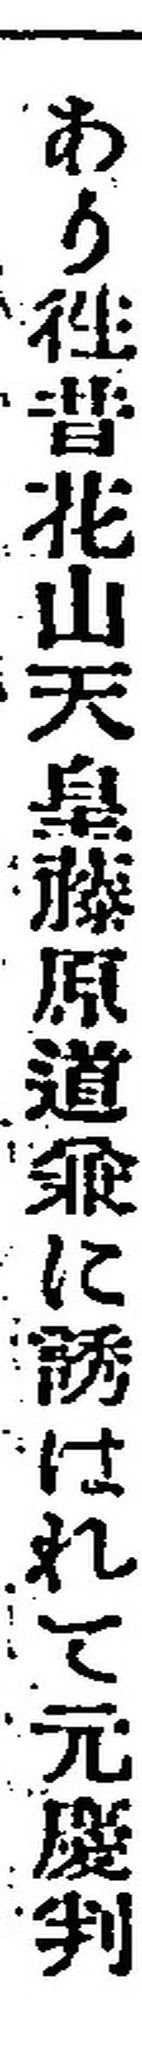あり往昔花山天皇藤原道兼に誘はれて元慶判
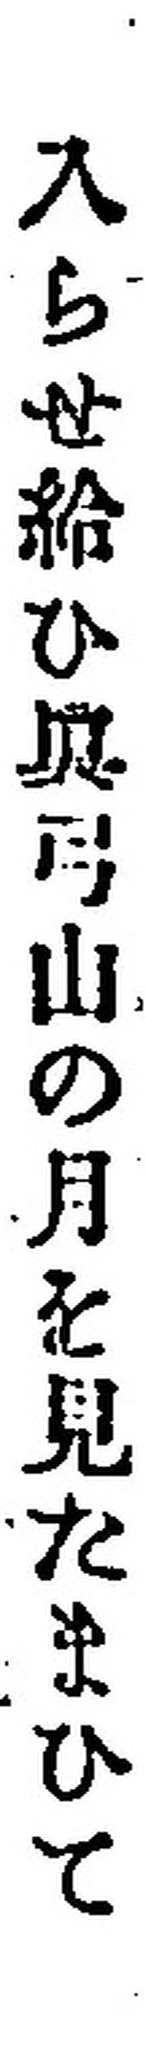入らせ給ひ真弓山の月を見たまひて
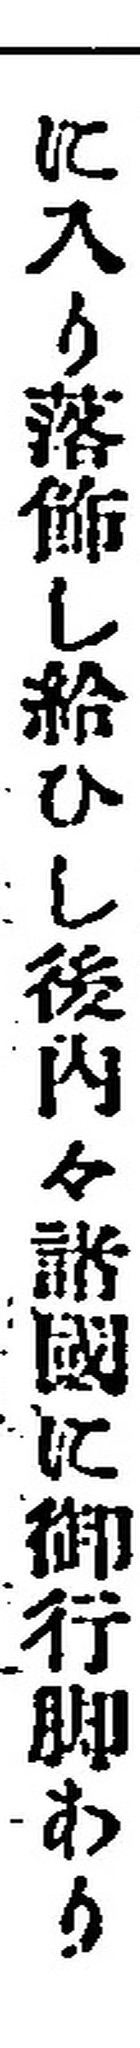に入り落飾し給ひし後内々諸国に御行脚あり
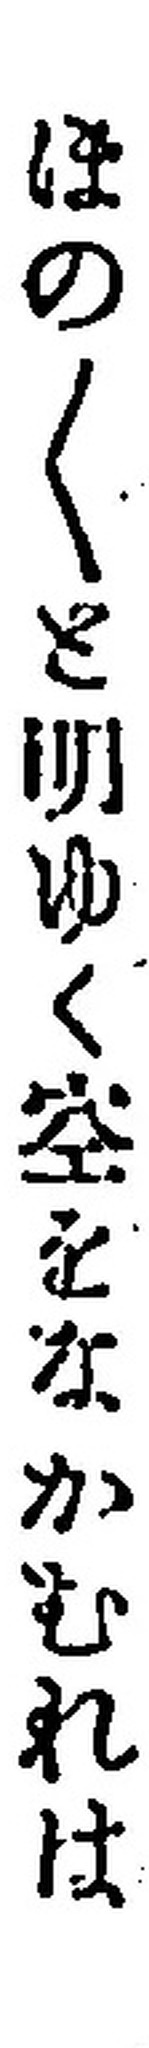ほの〳〵と明ゆく空をなかむれは
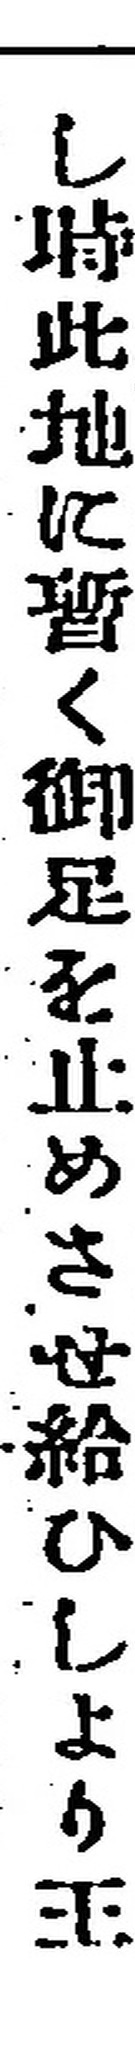し時此地に暫く御足を止めさせ給ひしより王
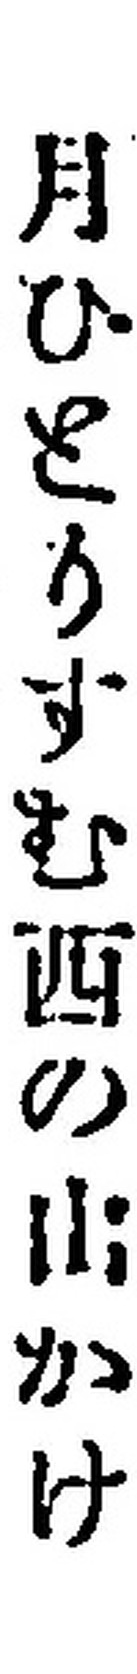月ひとりすむ西の山かけ
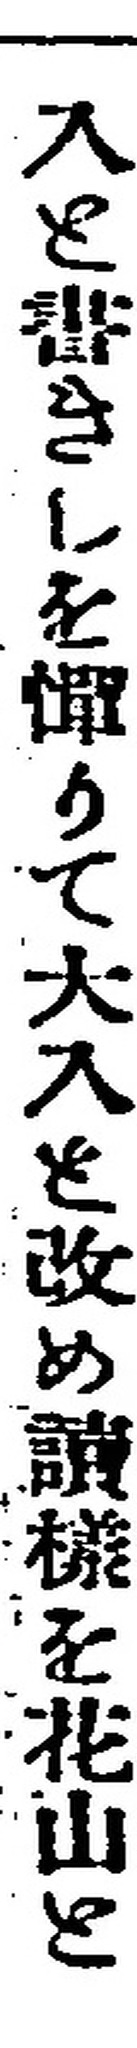入と書きしを憚りて大入と改め読様を花山と
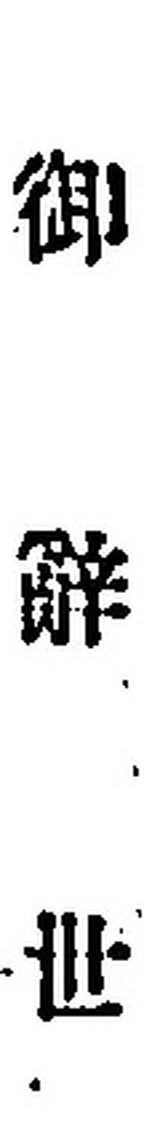御辞世
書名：東参名勝案内
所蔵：国立国会図書館 National Diet Library, JAPAN
